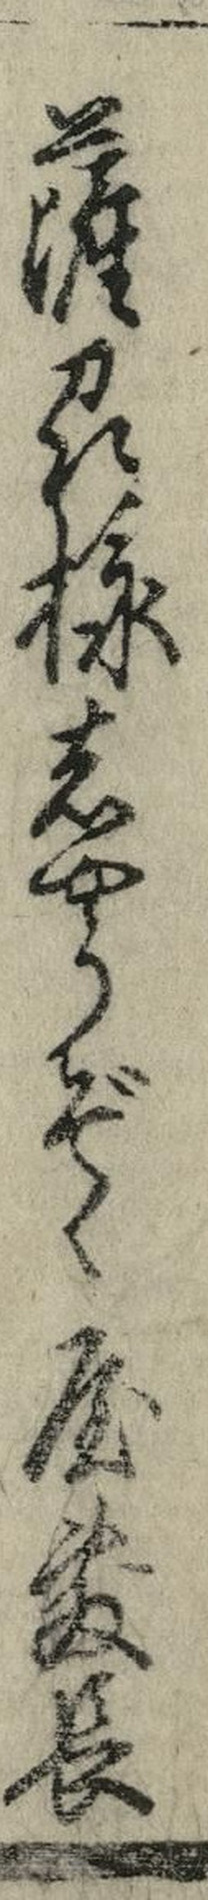薩州様しやうぞく屋敷長
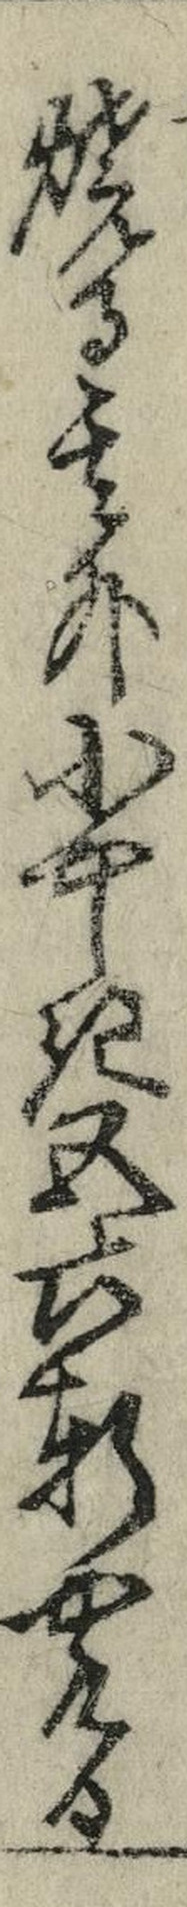焼る其外小やしき五六軒やける
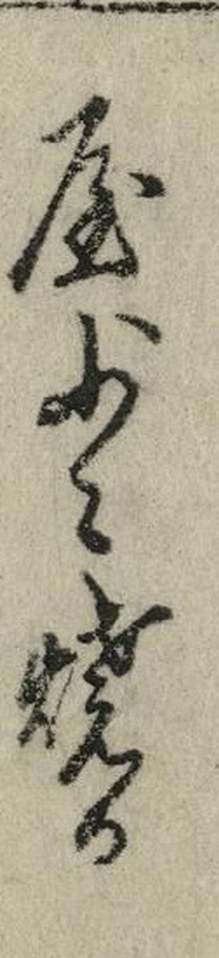屋少々焼る
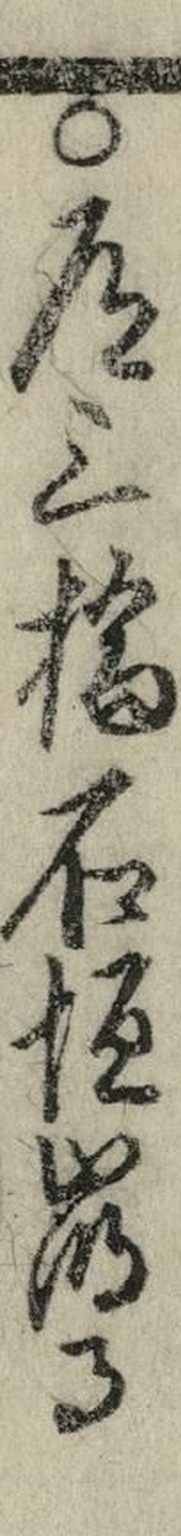○道三橋石垣崩る
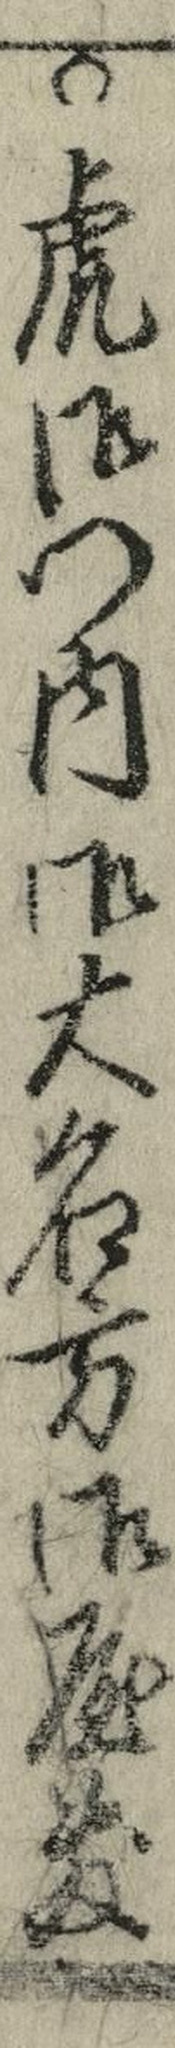○虎御門内御大名方御屋敷
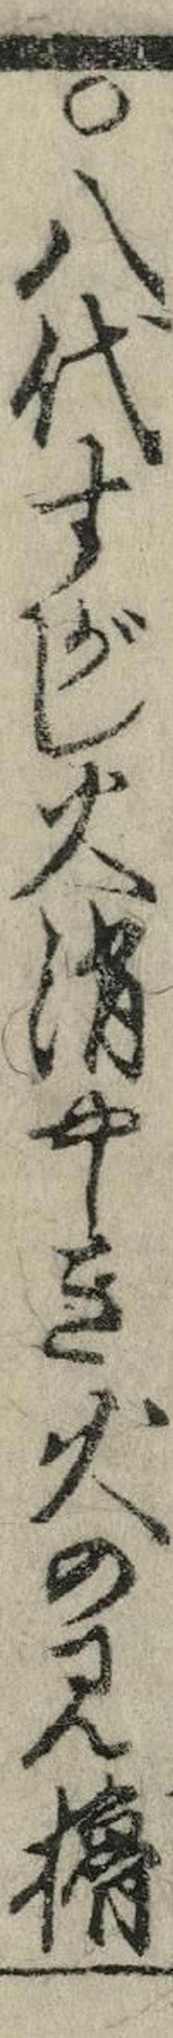○八代すがし火消やしき火の見櫓
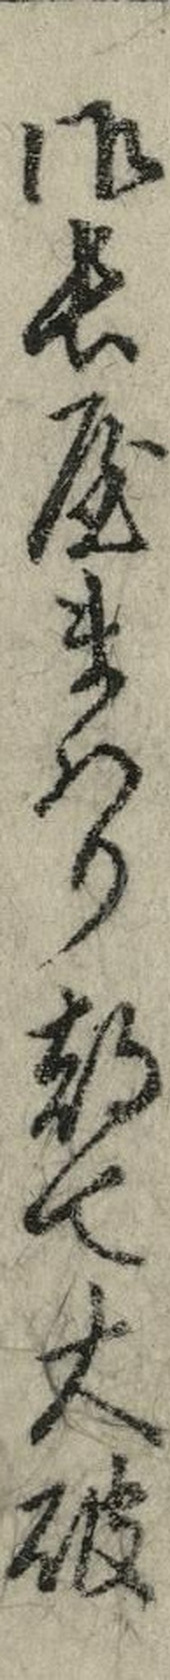御長屋まはり都て大破
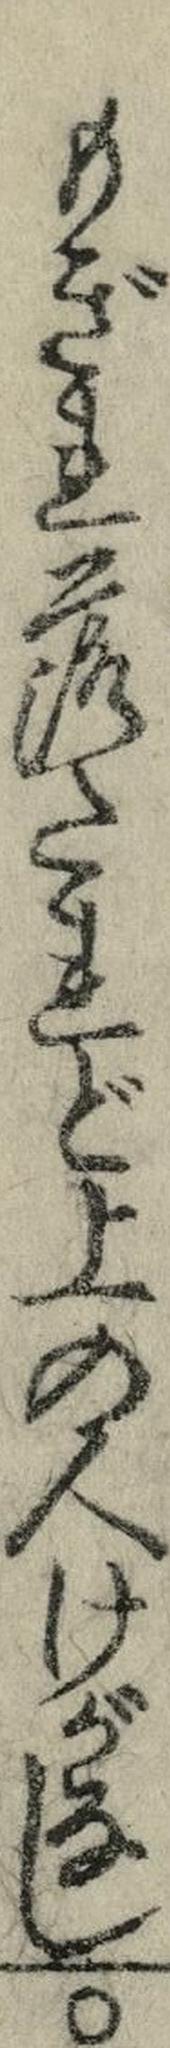もぎれ落たれど上の人けがなし
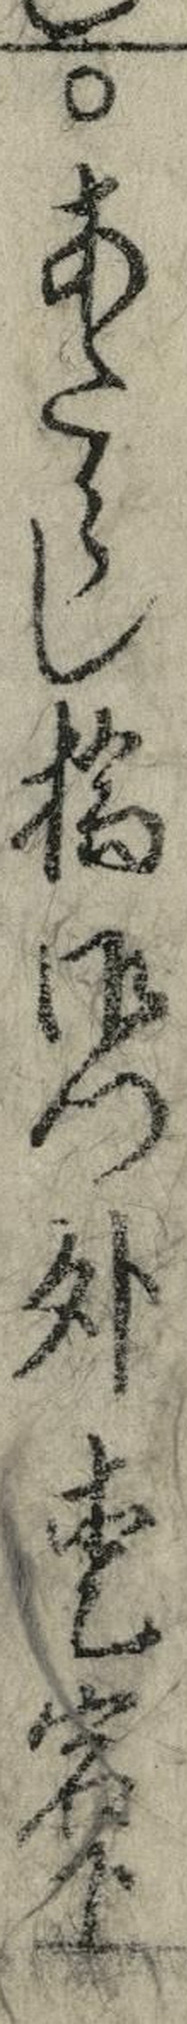○あたらし橋御門外愛宕下
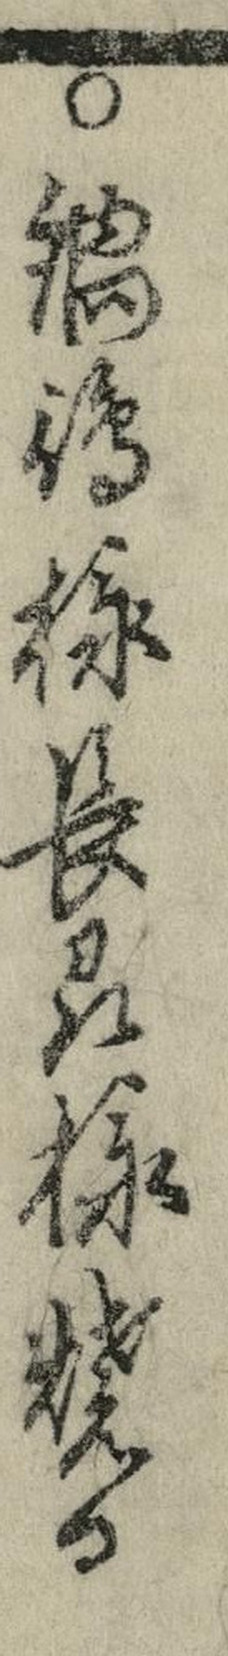○鍋嶋様長州様焼る
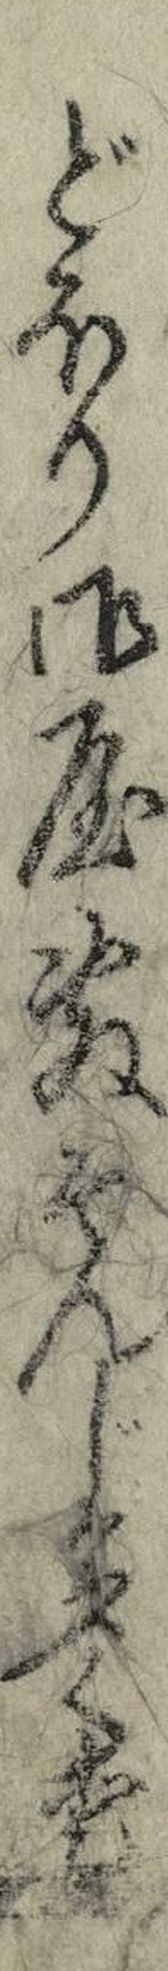どほり御屋敷そんじ多く愛
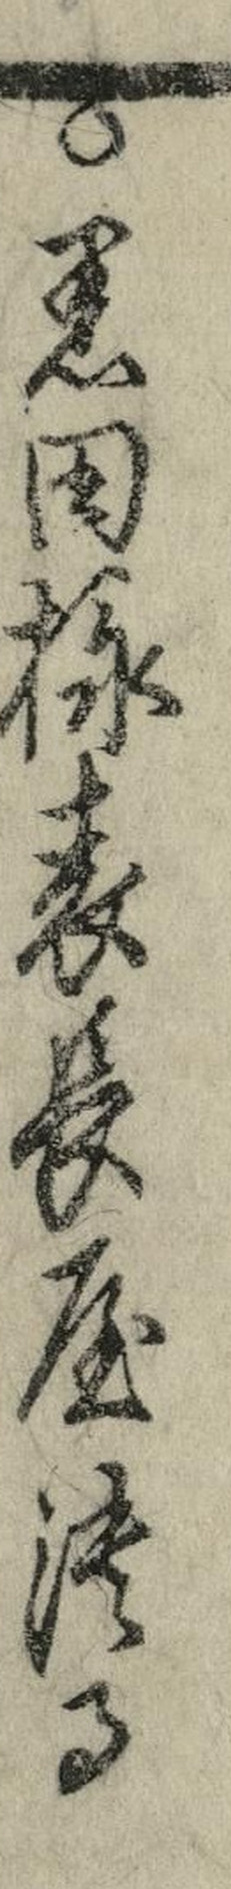○黒田様表長屋潰る
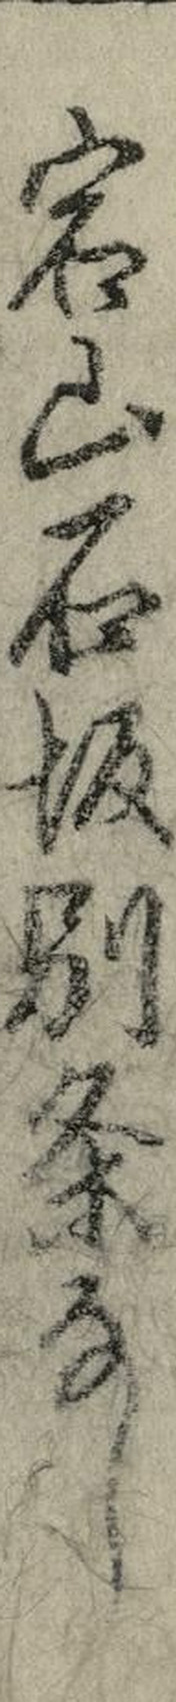宕山石坂別条なし

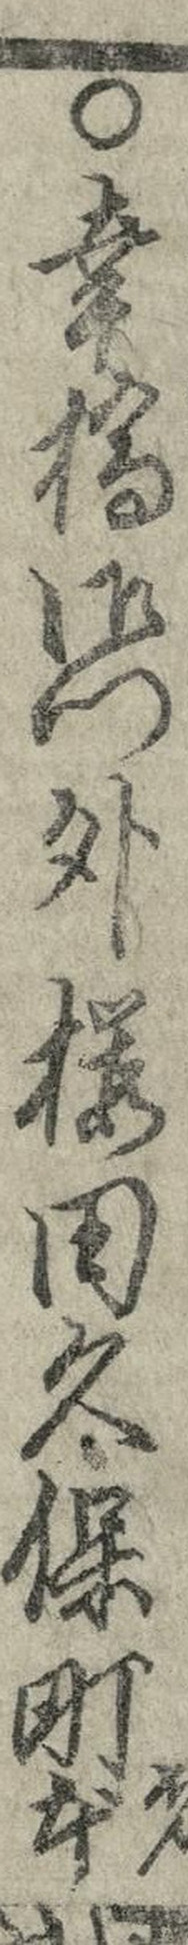○幸橋御門外桜田久保町本
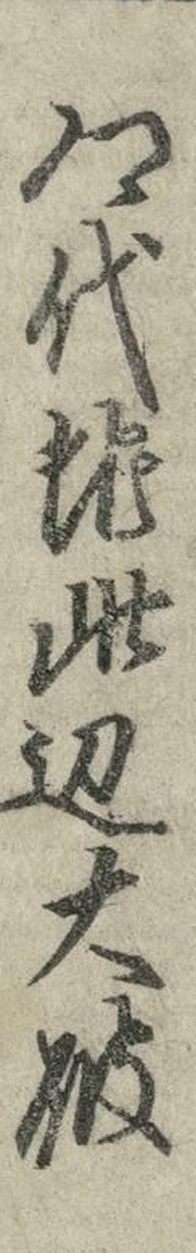郷代地此辺大破
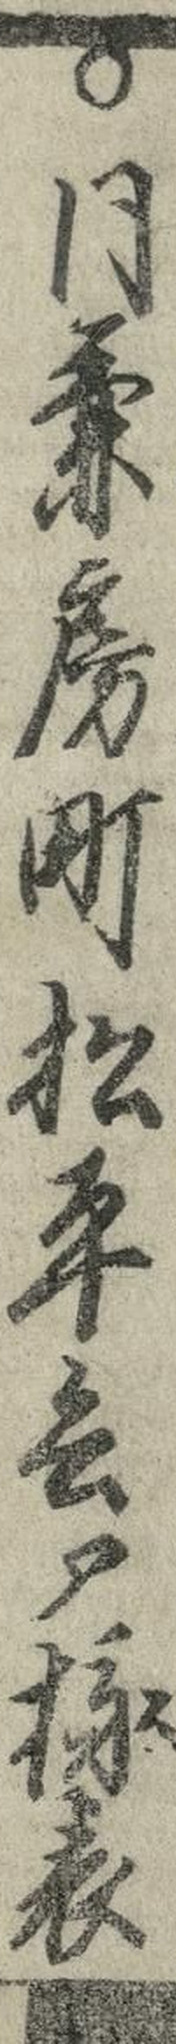○同兼房町松平兵部様表
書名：江戸　大地震末代噺の種　全
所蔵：東京大学地震研究所図書室 Earthquake Research Institute Library, The University of Tokyo, JAPAN
